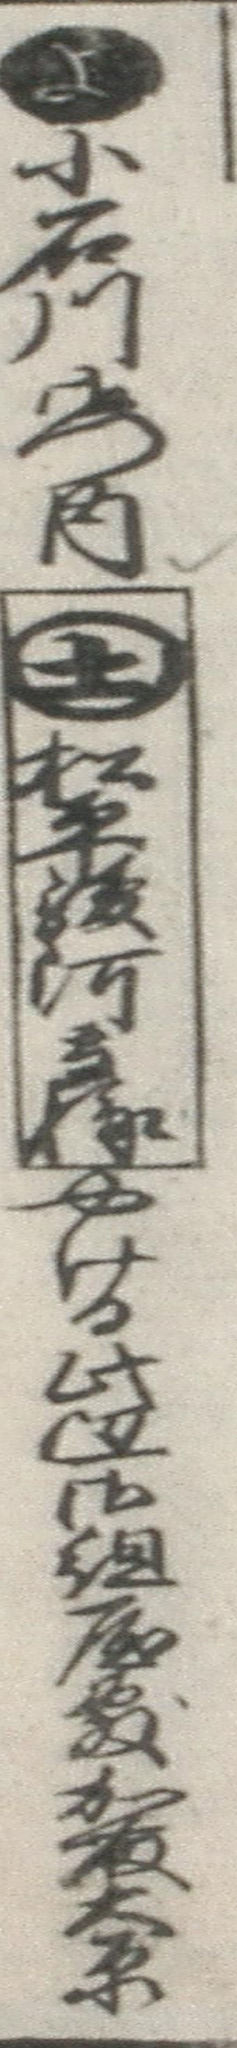よ小石川御門内松平駿河守様やける此辺御組屋敷加藤大原
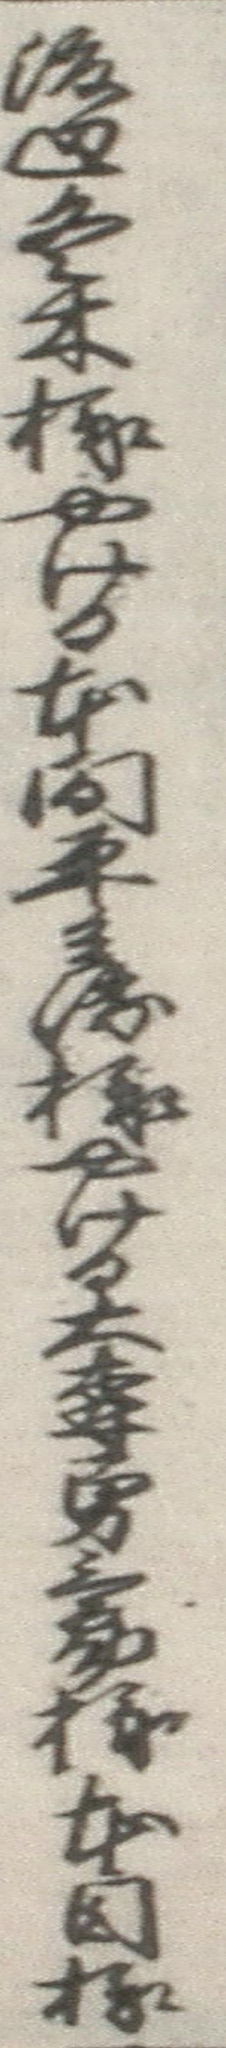渡辺冬木様やける本間平兵衛様やける大森勇三郎様本目様
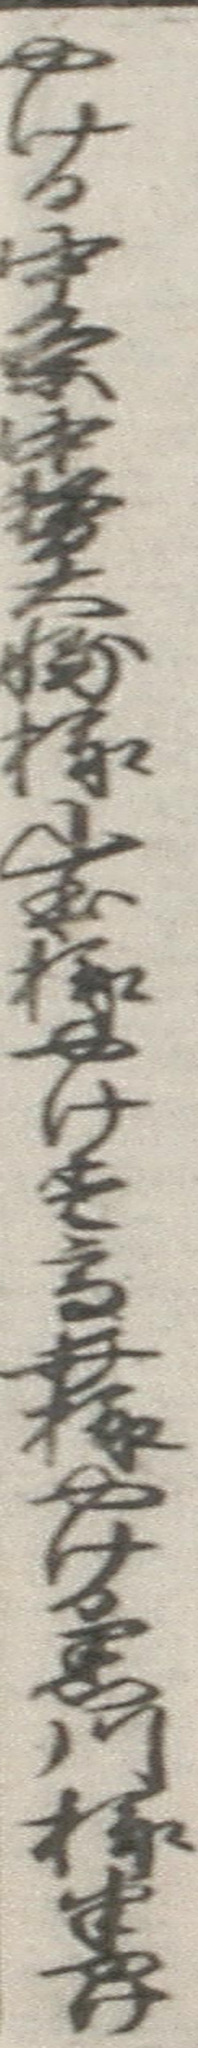やける中条中務大輔様山本様やけす高井様やける黒川様半やけ
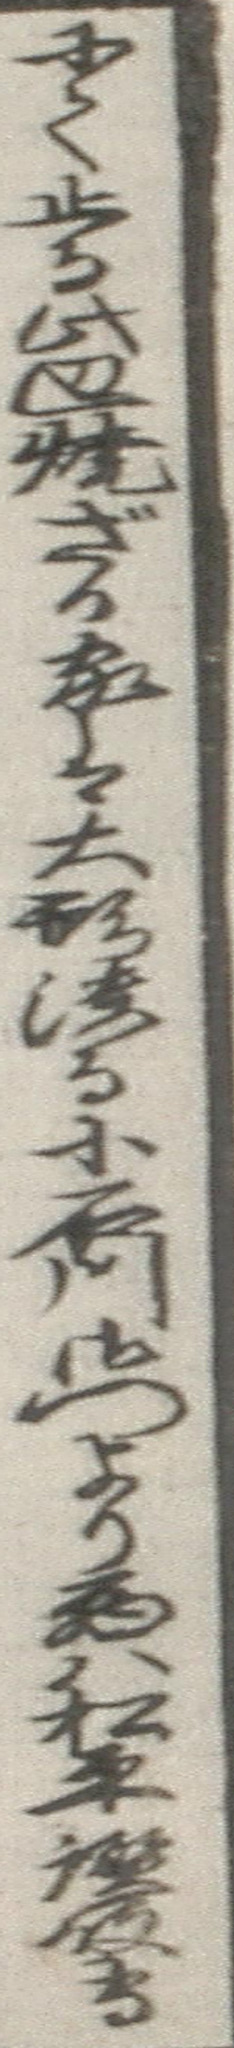にて止る此辺焼ざる家は大形潰る小石川御門より西は松平讃岐守
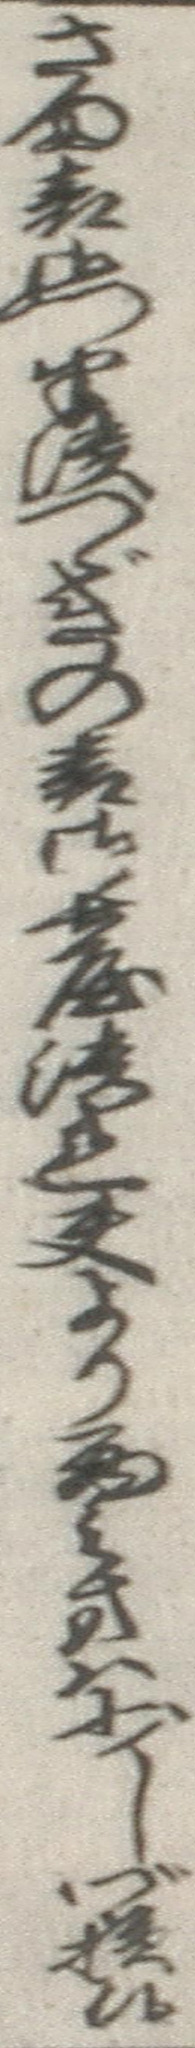さま表御門半潰つぎの表御長屋潰れ夫より西之方は少しづゝ損候
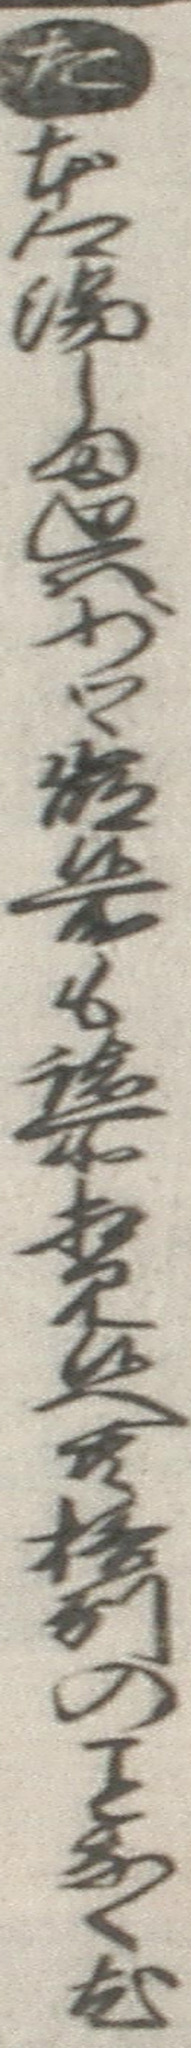た本郷湯しま辺は少つヽ崩候所も諸所相見候へ共格別のことなく尤
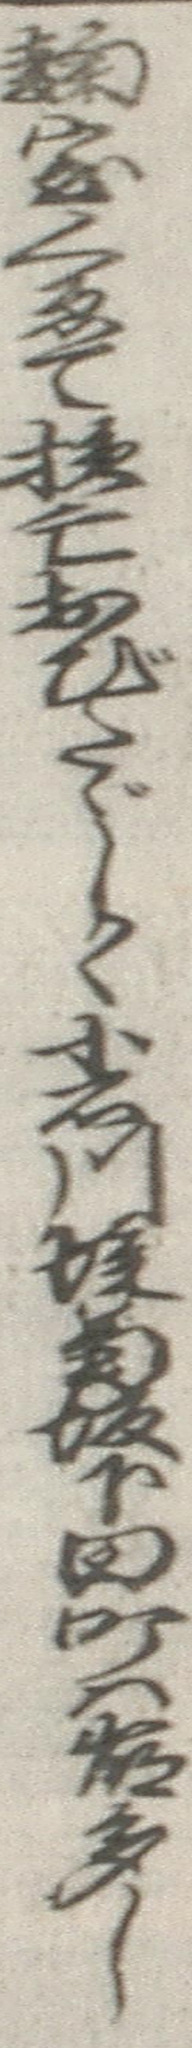麹室くゑて損亡おびたゞしく小石川境菊坂下田町は崩多し
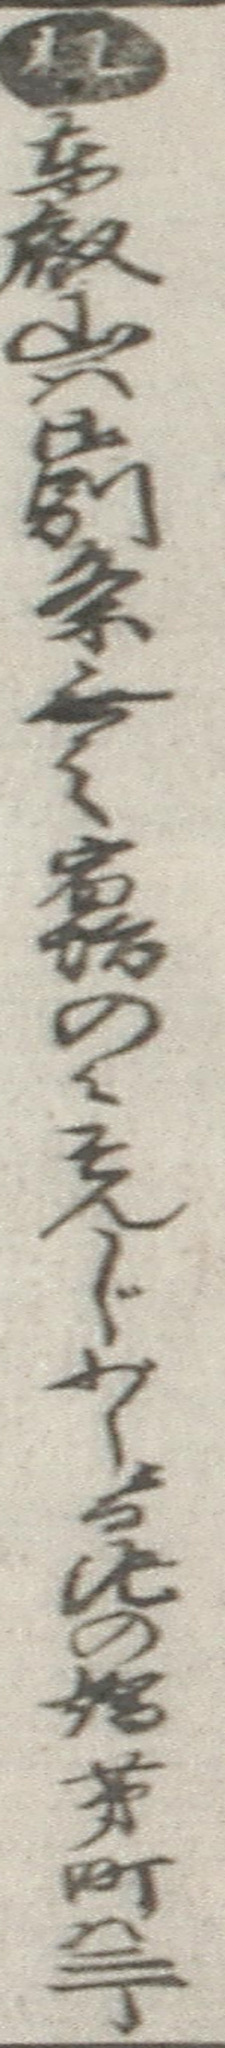れ東叡山は御別条無之宿坊のみそんじ少しにて池の端茅町は二丁
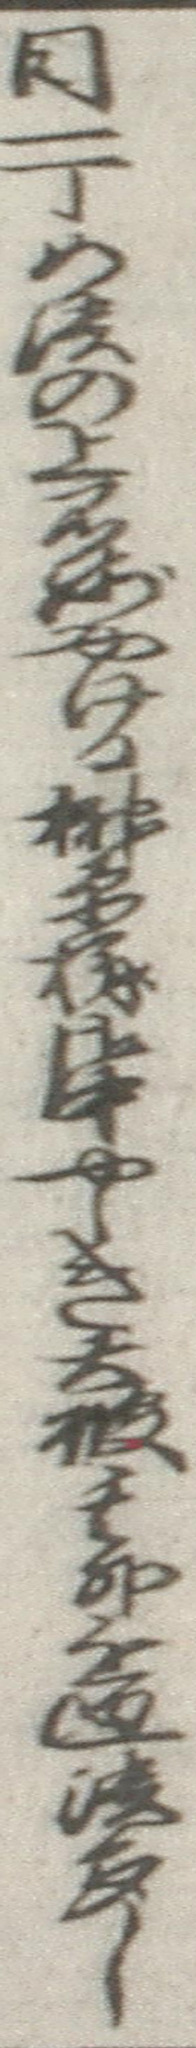目一丁め潰の上不残やける榊原様御中やしき大破其外近辺潰多し
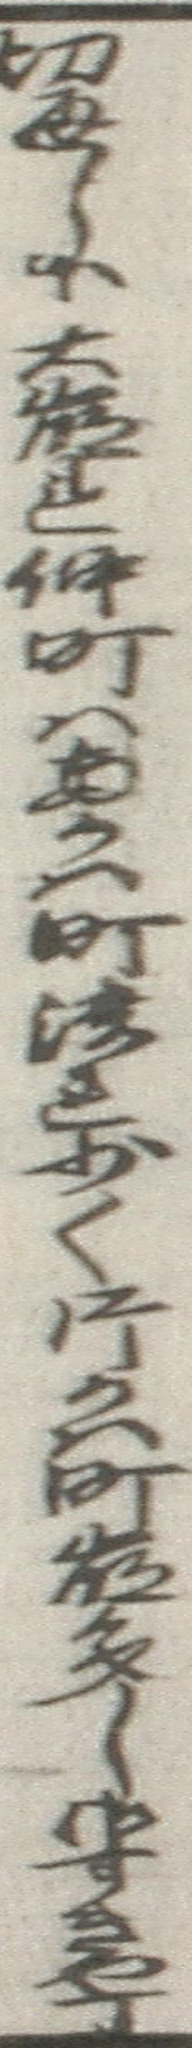切通しハ大崩れ仲町は両かは町潰れ少く片かは町崩多し御すきや丁
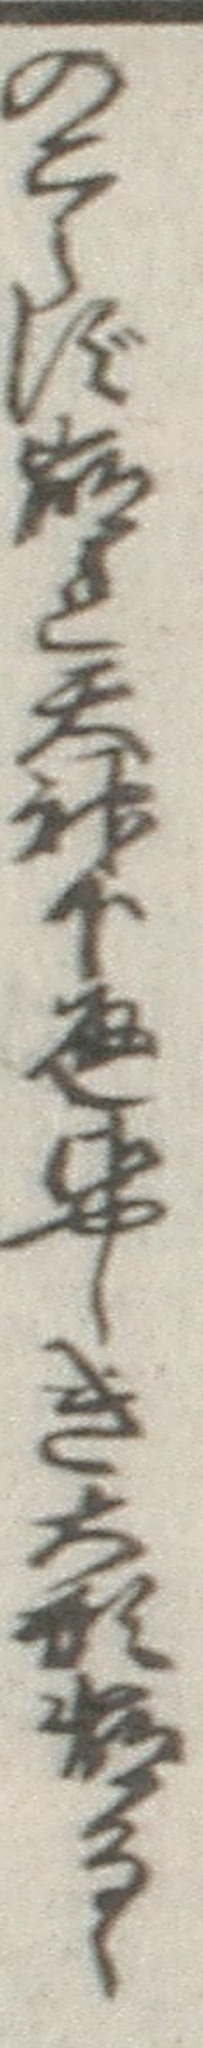のこらず崩れ天神下通御やしき大形崩るゝ
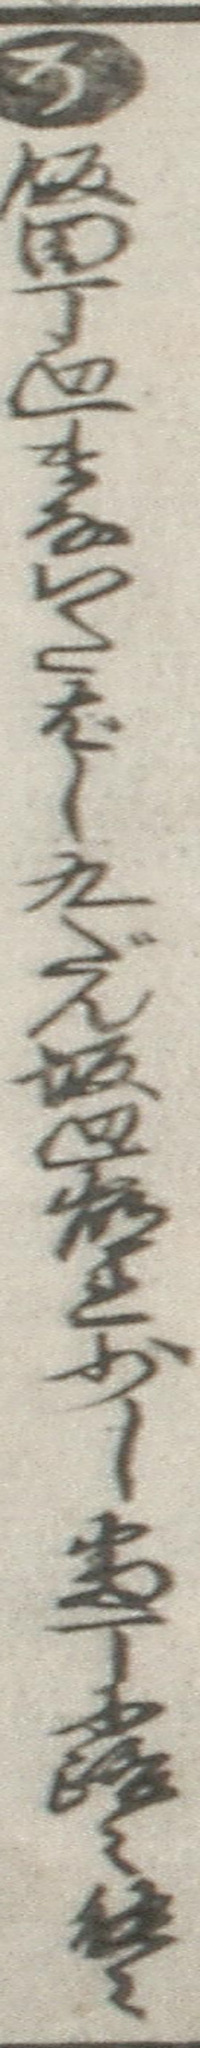そ飯田丁辺まないたばし九だん坂辺崩れ少し番丁小路之能〻
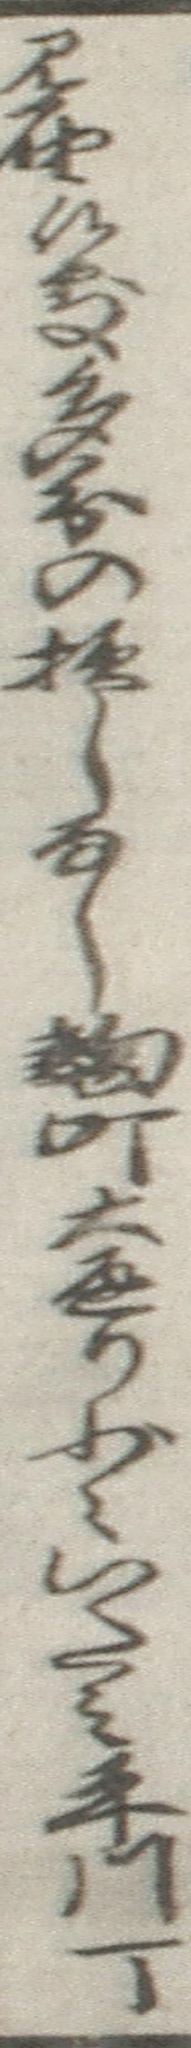見届候処多分の損しなし麹町大通り少〻いたみ平川丁

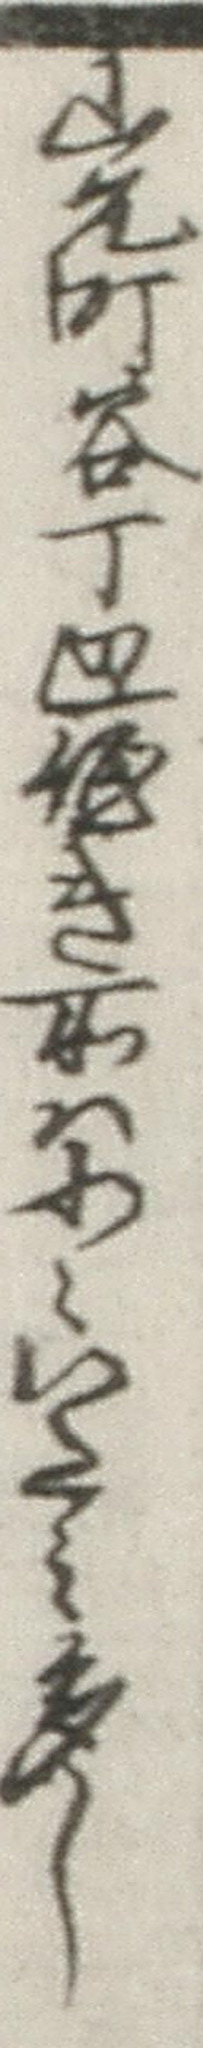山元町谷丁辺低き所は少〻いたみ多し
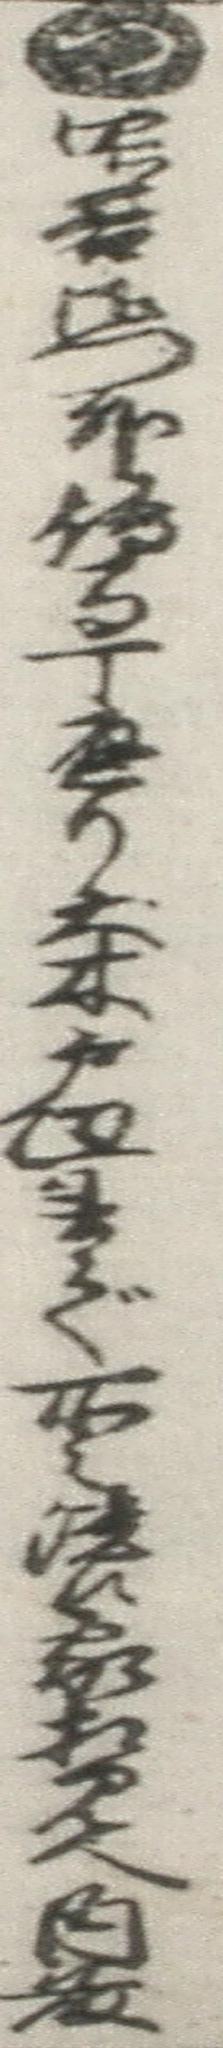つ四ツ谷御門外傳馬丁通り大木戸辺まで所〻潰候家相見へ内藤
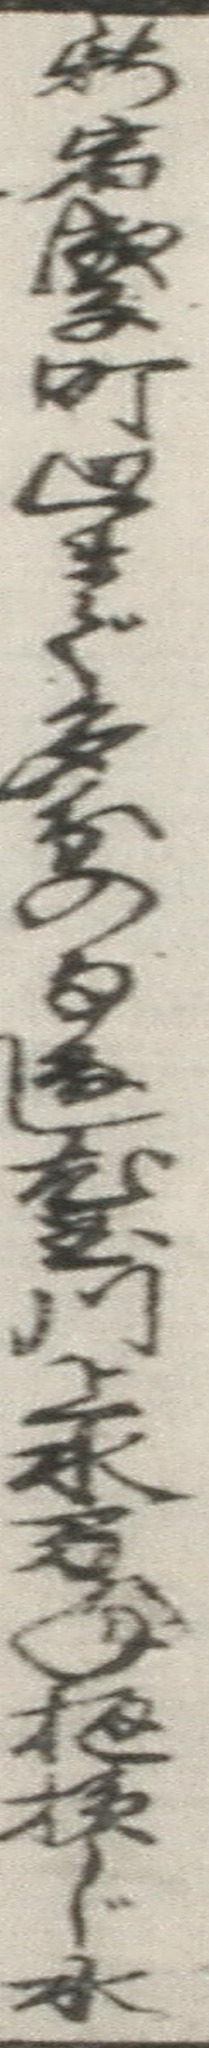新宿成子町辺まで多分の事なし尤玉川上水万年樋損じ水
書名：大地震焼場細見記
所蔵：東京大学地震研究所図書室 Earthquake Research Institute Library, The University of Tokyo, JAPAN
